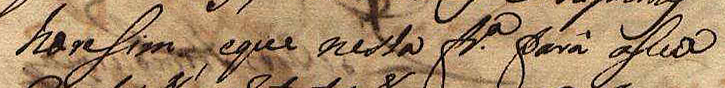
hæresim, e que nesta fr.a fará a sua
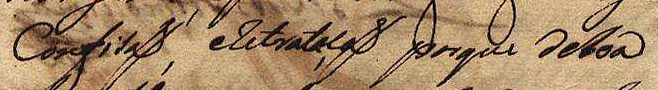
Confissaõ e Retrataçaõ porque de boa
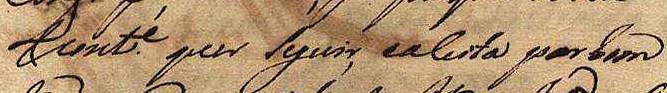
& cont.e quer seguir, e aCeita por bem
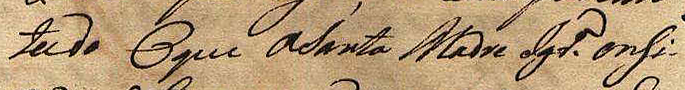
tudo O que a Santa Madre Igr.a ensi
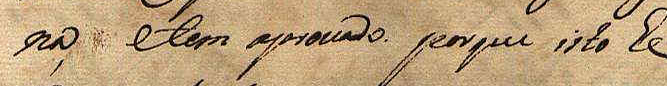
na, e tem aprouado. porque isto he
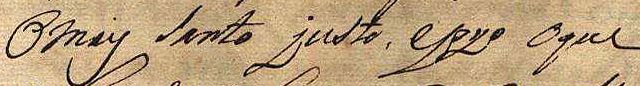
O mais santo justo, e pyo o que
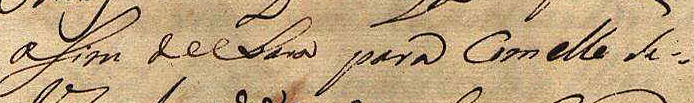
asim declara para Com elle se
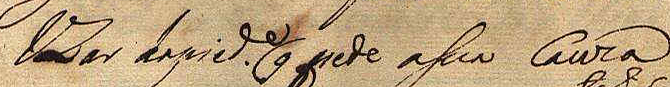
VZar da pied.e q̄ pede a sua Cauza
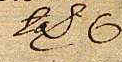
taõ o
